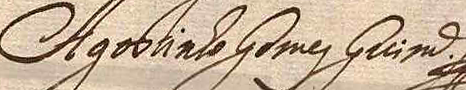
Agostinho Gomes Guim.es
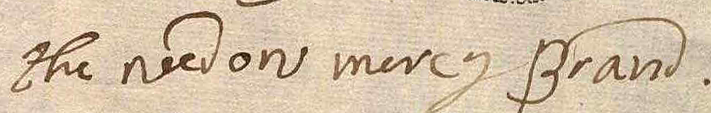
the wedow mercy Brand.
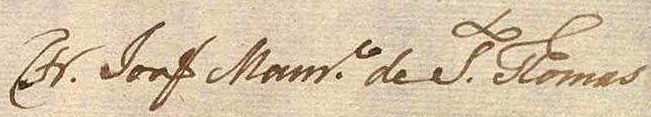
Fr. Ioaõ Mam.co de S.to Thomas
